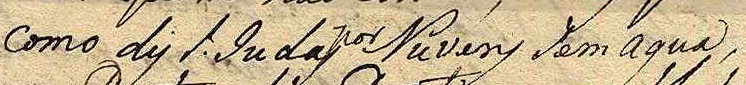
como dis S. Iudas por Nuvens sem agua,
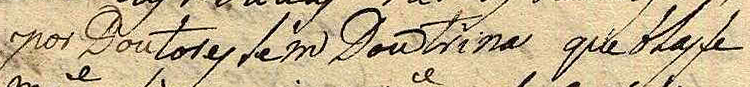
por Doutores Sem Doutrina que o bLasfe
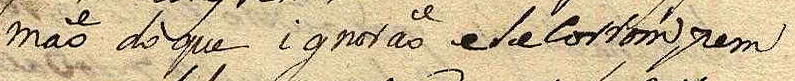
maõ do que ignoraõ e se corrompem
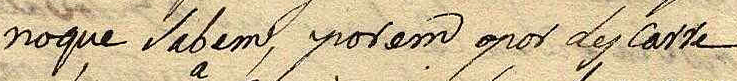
no que sabem, porem o por descarre
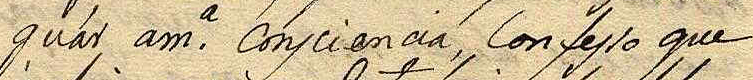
guár a m.a consciencia, Confesso que
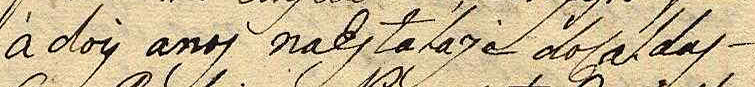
á dois anos na Estalaje do Caldas
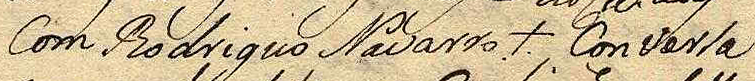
Com Rodriguo Navarro + Conversa
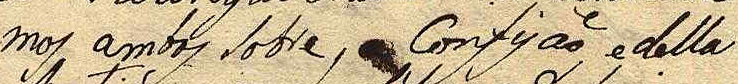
mos ambos sobre _ Cofisaõ e della
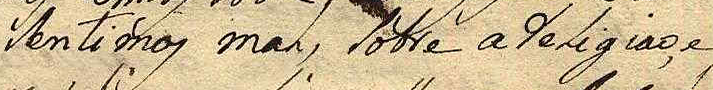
sentimos maL, sobre a religiaõ, e
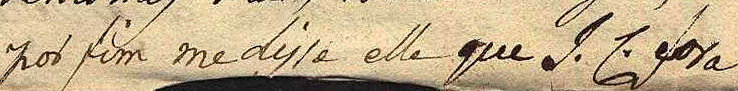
por fim me disse elle que I. C. e fora
